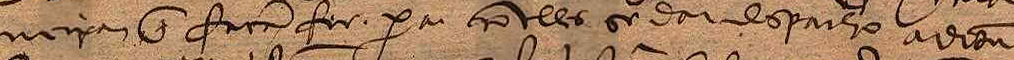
neira q̄ façā fee . ꝑa c̄o elles se dar despacho a dita
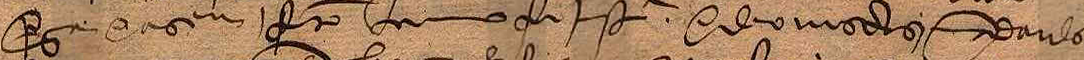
p̄sa e a seu ftō como for Justa. e de o uos Asj mādardes
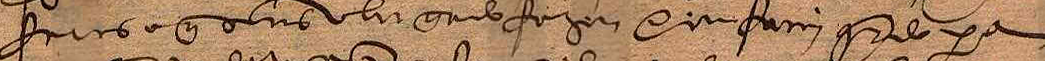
fares o q̄ soes obrigado fazer e eu farej quādo ꝑa
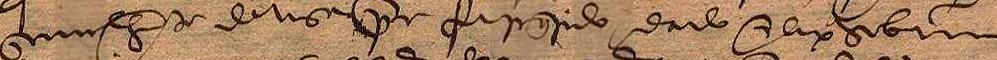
melhāte de vosa p̄te for req̄rido / dado ē lixa sob meu
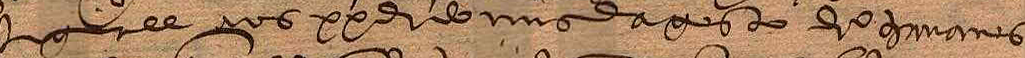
signall aos xx di do mes dagosto djo trauaços
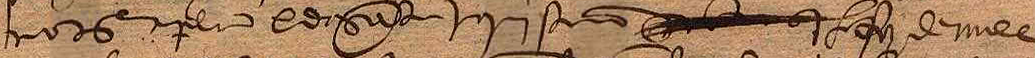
notro apl̄co e da sāta Jnqujsição q̄ este es ho fez de mill
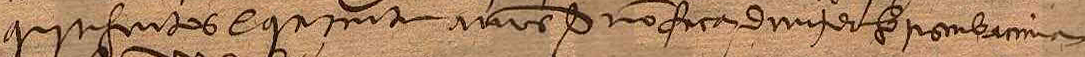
qujnhentos e quarenta anōs nō faça duujda ho riscado acima
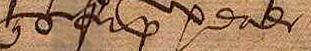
q̄ se fez p̄o ꝟdade /
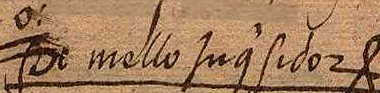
Jo de mello Jnqisidor
